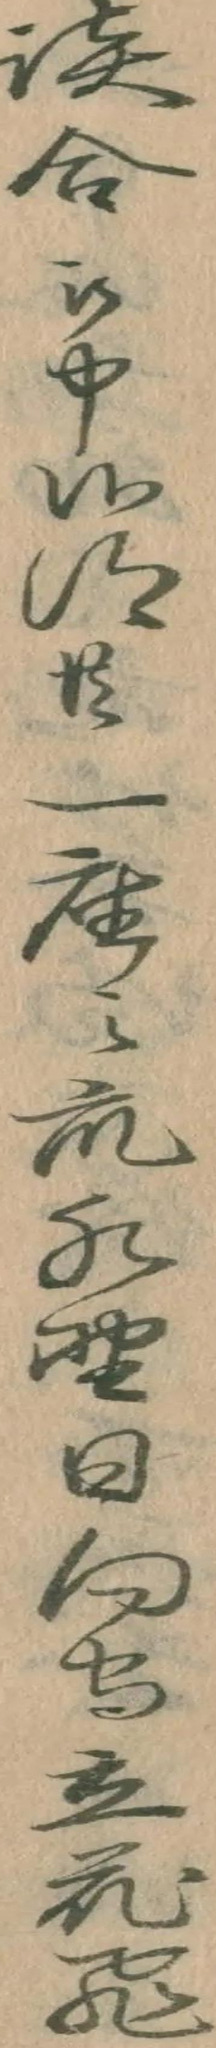談合被申候得共一座之衆水野日向守立花飛
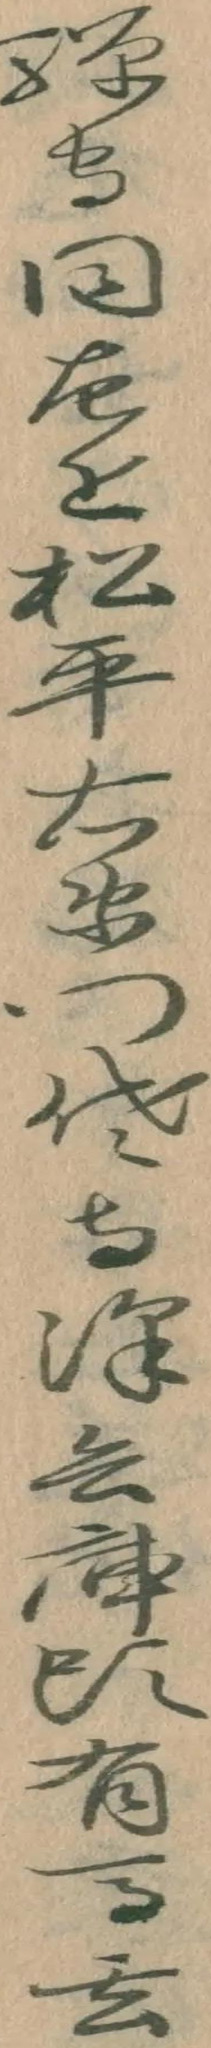騨守同左近松平右衛門佐寺沢兵庫頭有馬玄
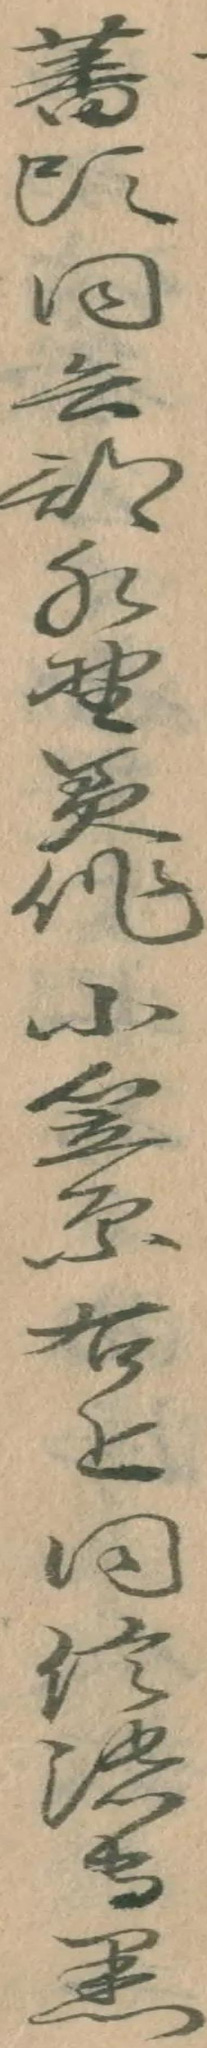蕃頭働兵部水野美作小笠原右近同信濃守黒
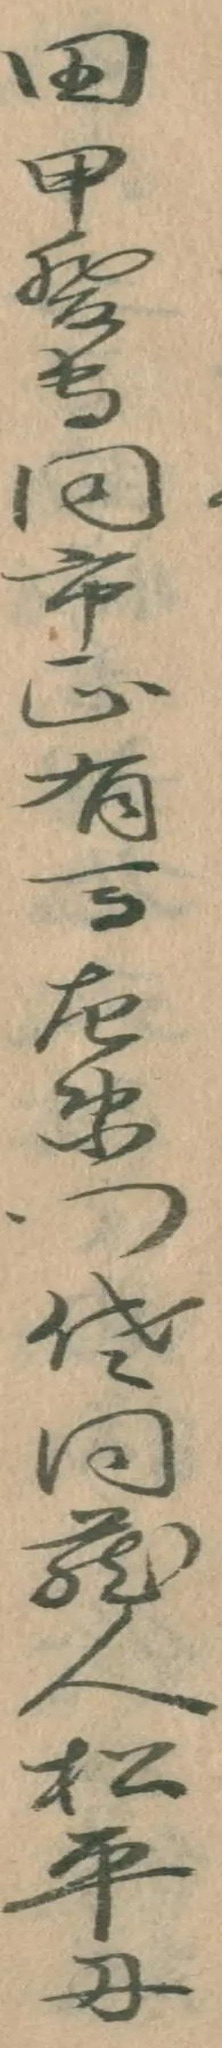田甲斐守同市正有馬左衛門佐同蔵人松平丹
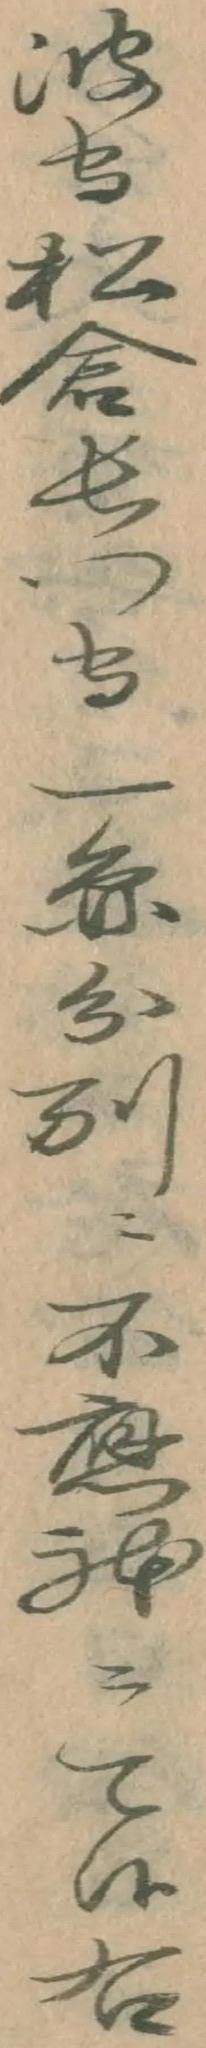波守松倉長門守一円分別に不應躰にて候右

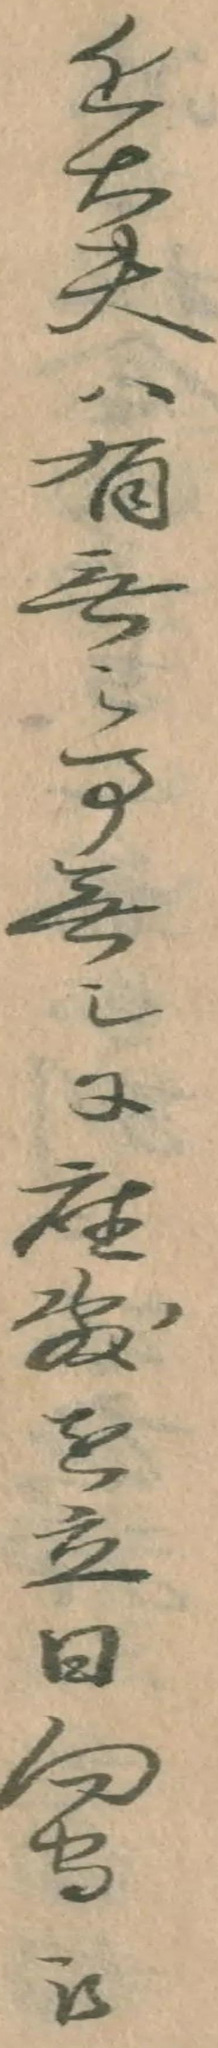近太夫は有無之事無し尓座敷を立日向守被
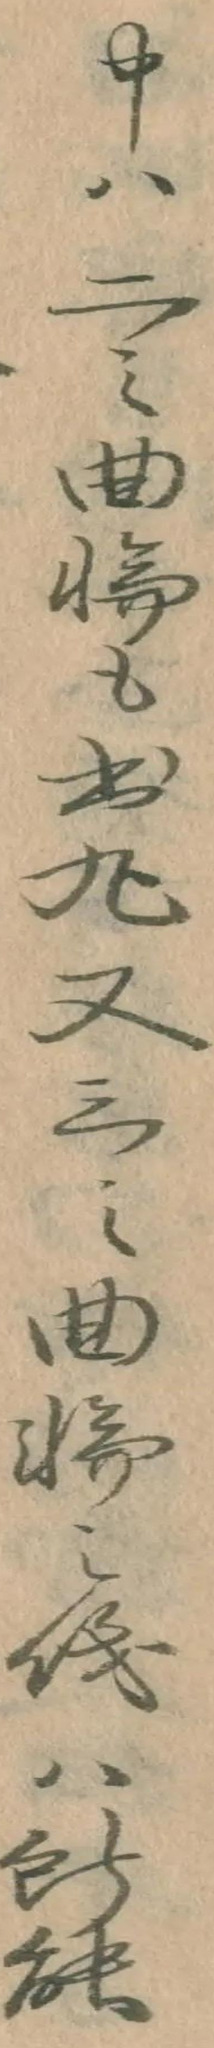申は二之曲輪も出丸又三之曲輪之儀は新能
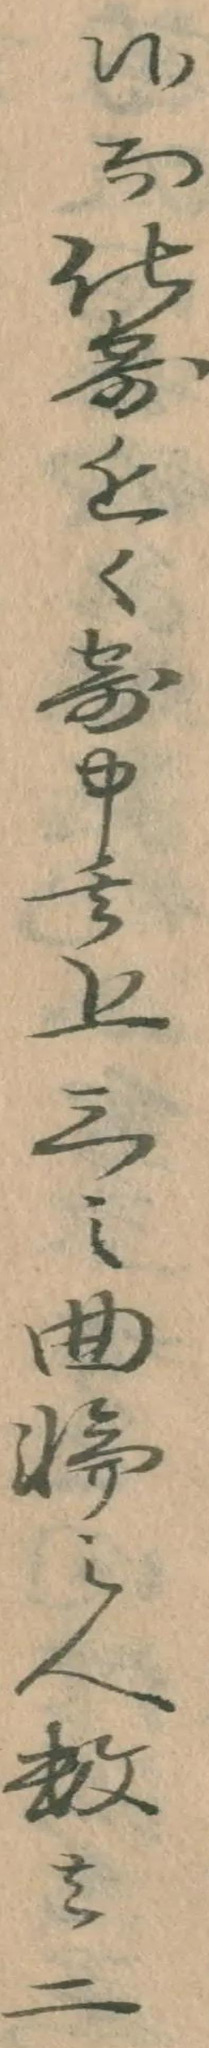候而仕寄近く寄申其上三之曲輪之人数者二
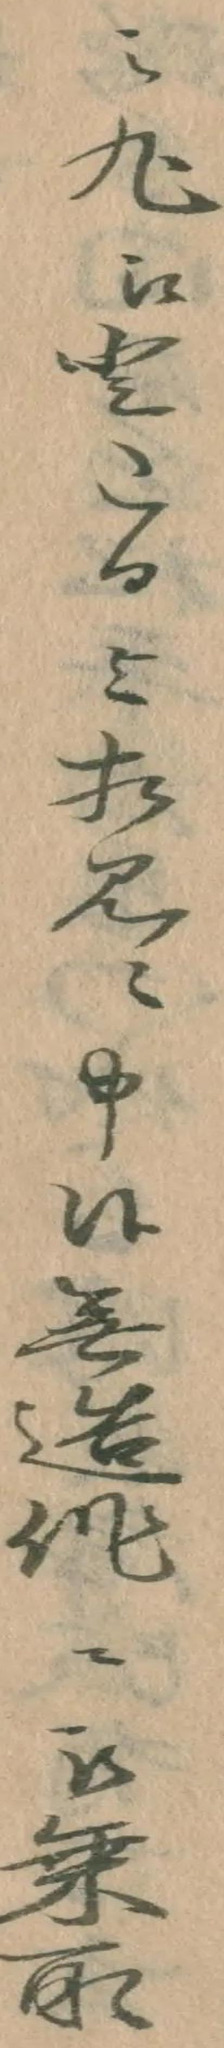之丸江登たる与相見に申候無造作に被乗取
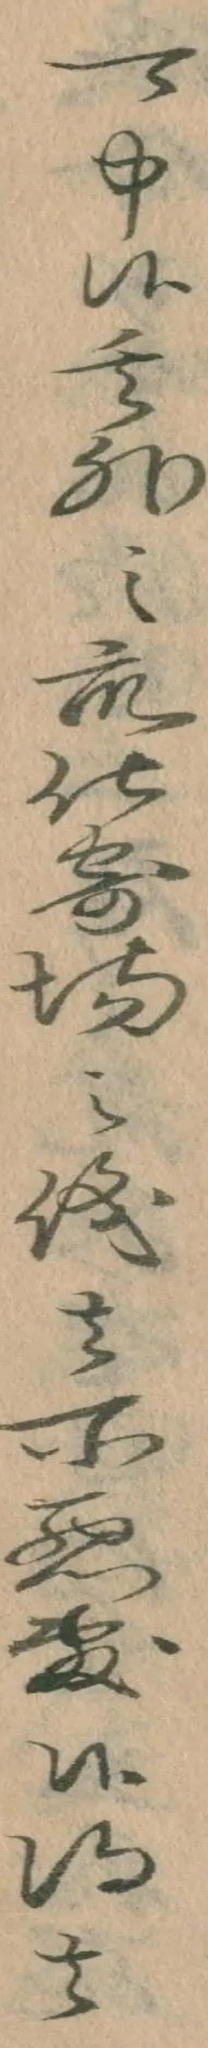可申候其外之衆仕寄場之儀者所悪敷候得者
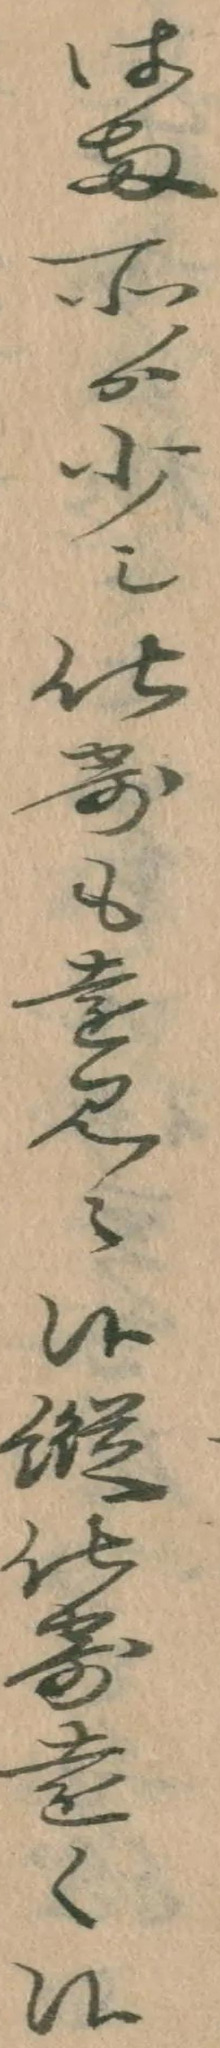御両所ゟ少し仕寄も遠見に候縦仕寄遠く候
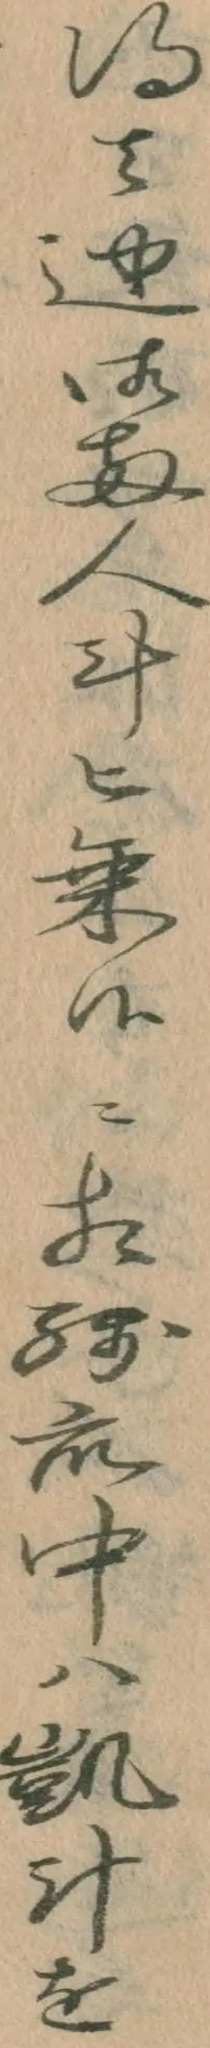得者迚御両人斗被乗候に相残衆中は凱斗を
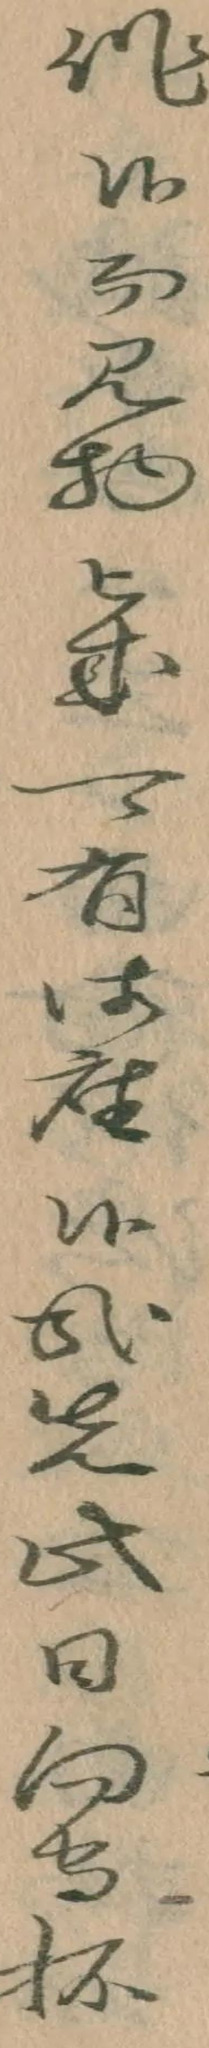作候而見物被成可有御座候哉先此日向守抔
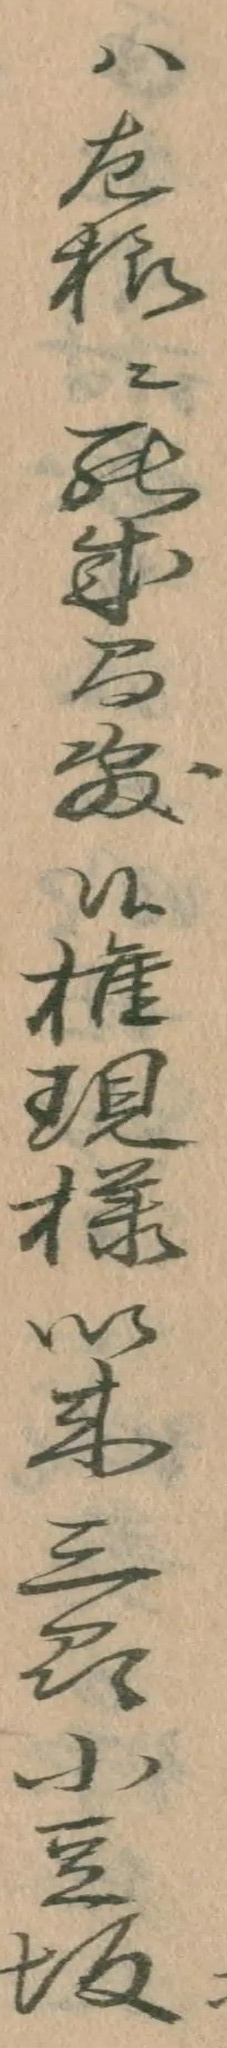は左様に罷成間敷候権現様以来三州小豆坂
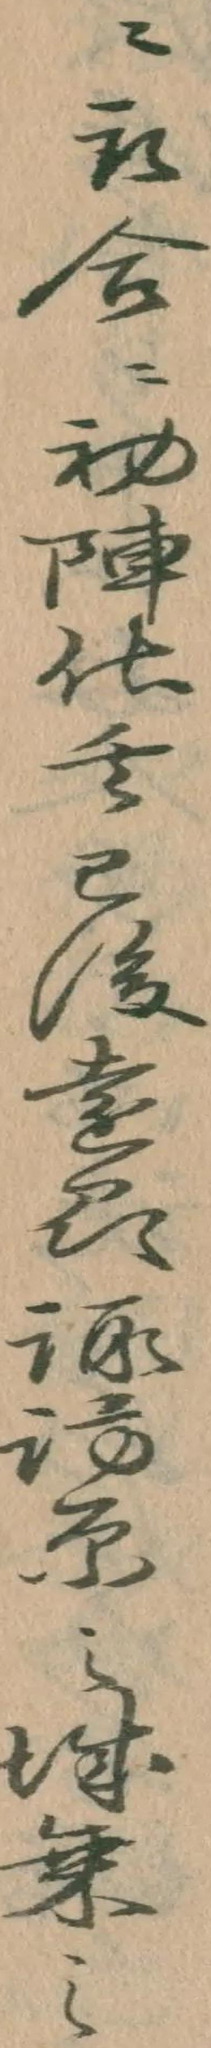に取合に初陣仕其已後遠州諏訪原之城乗之
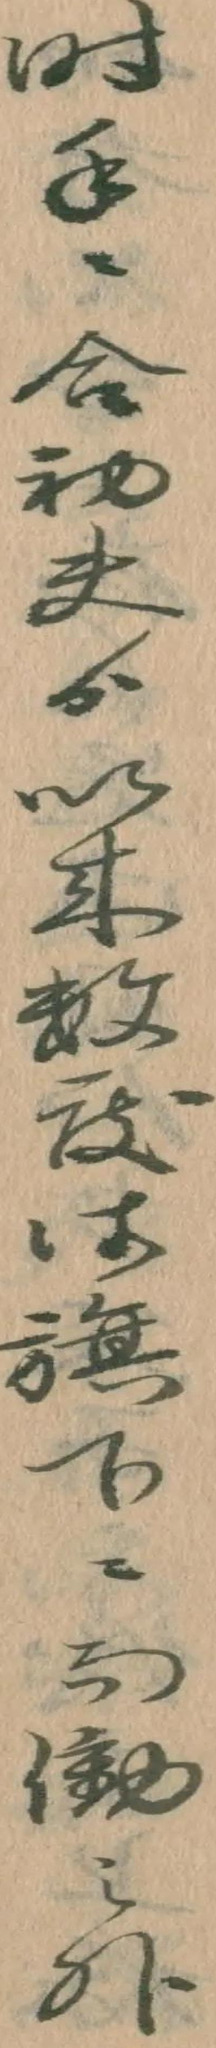時手に合初夫ゟ以来数度御旗下に而働之外
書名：切支丹御退治記 49巻. [7]
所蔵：国立国会図書館 National Diet Library, JAPAN
